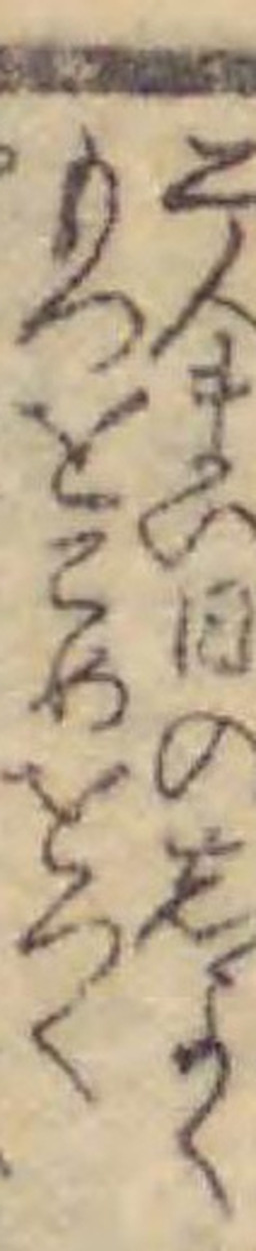もつをこめをつく
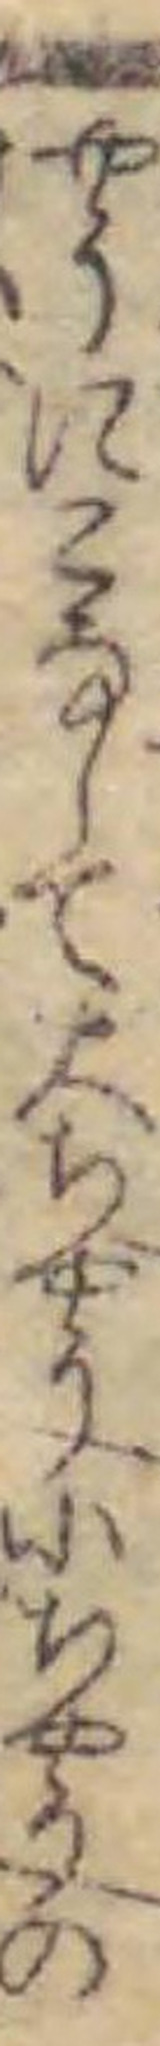やうにこなして大ちやう小ちやうの
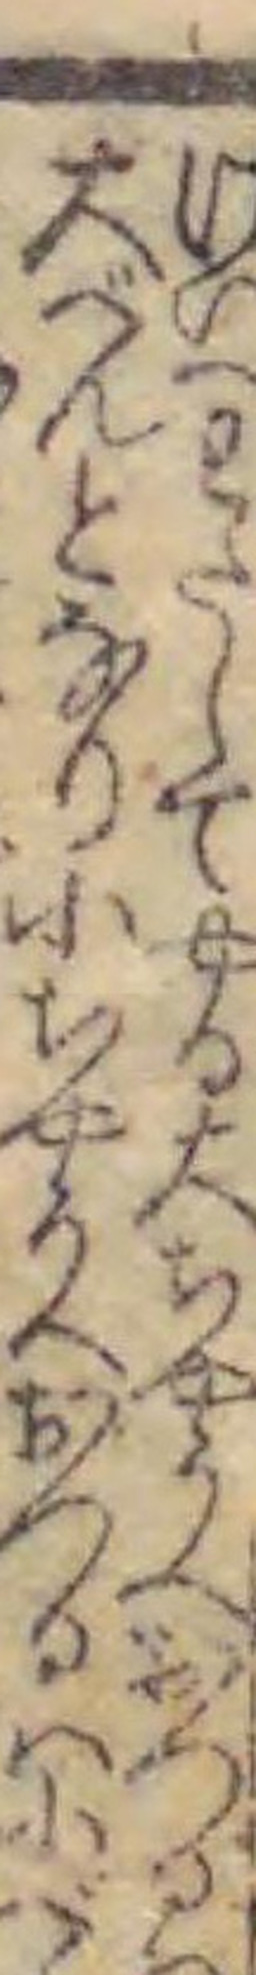大べんとなり小ちやうへおつるは小べん
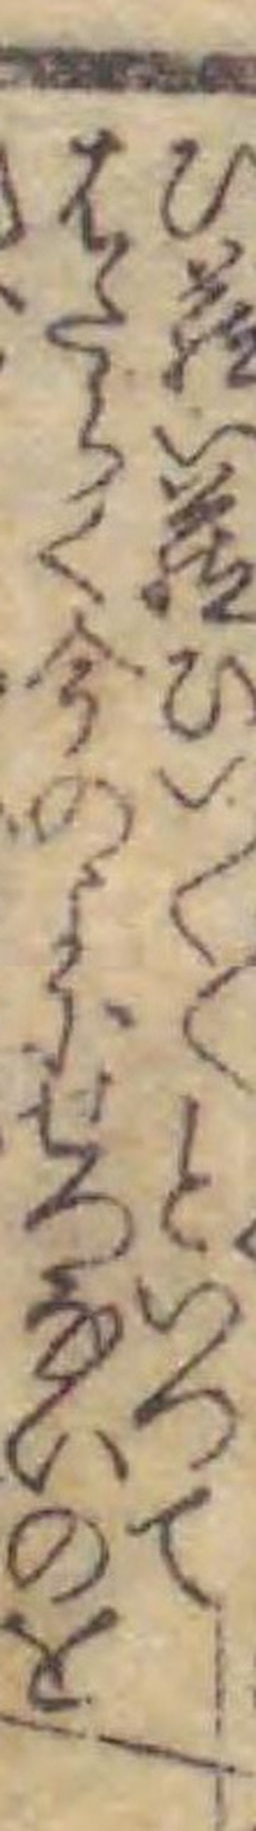はたらく今のよにせつないのを
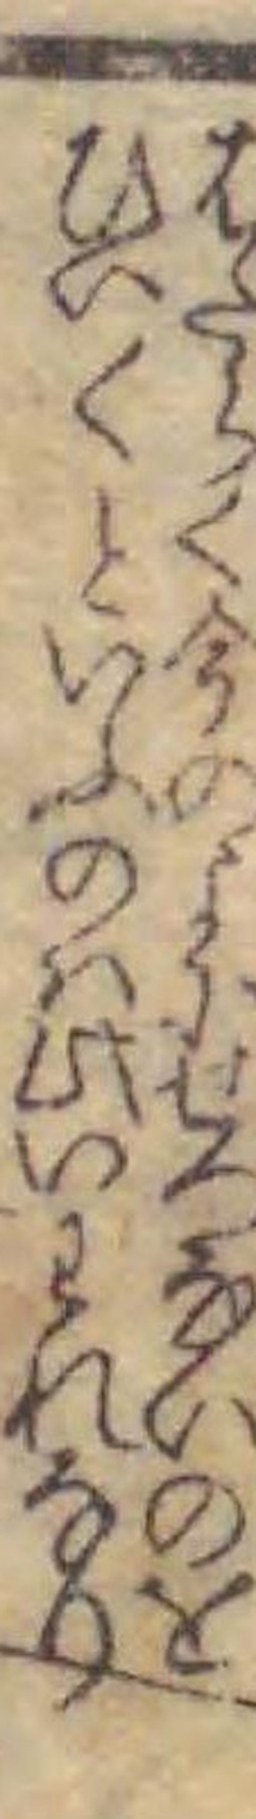ひい〳〵といふのは此いわれなり
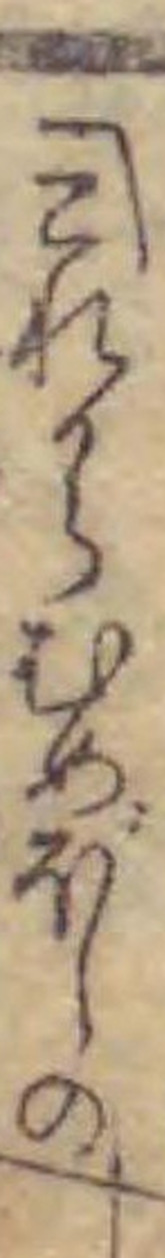〽これからむめぼしの
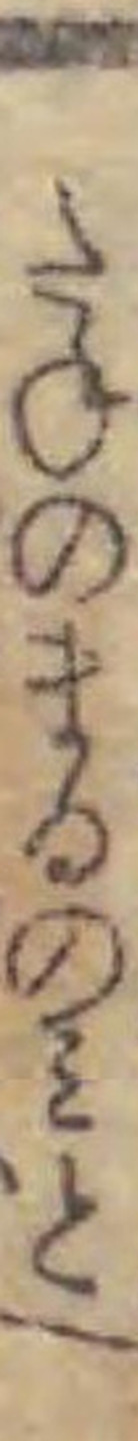たねのまるのみと
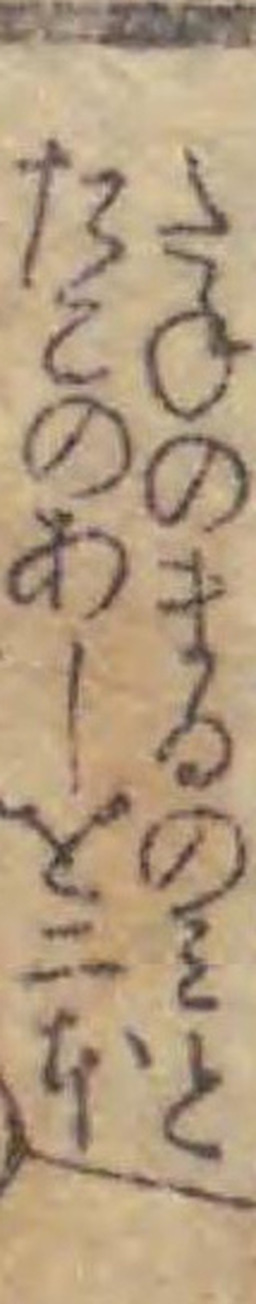たこのあしを二本
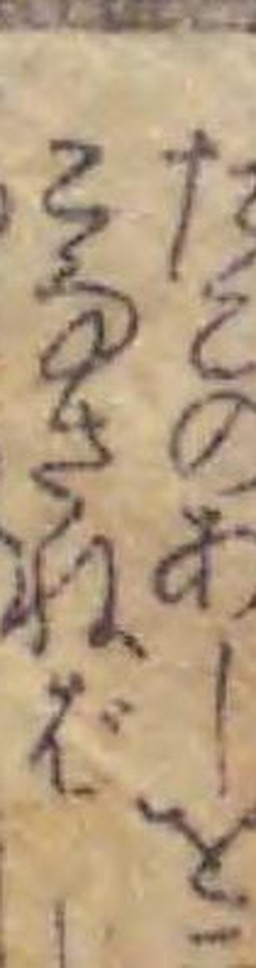こなさねば
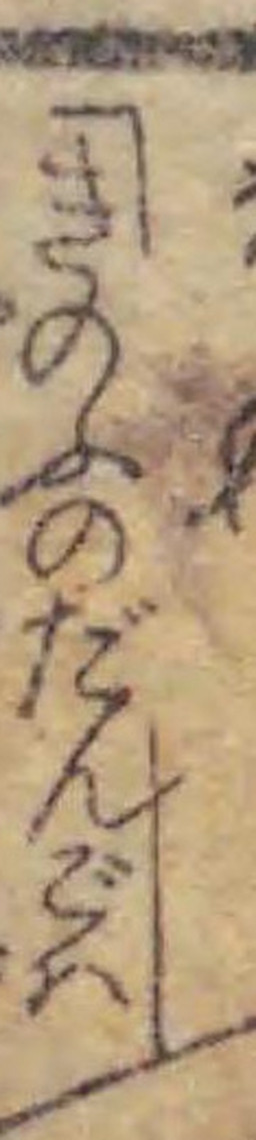〽きのふのだんごは
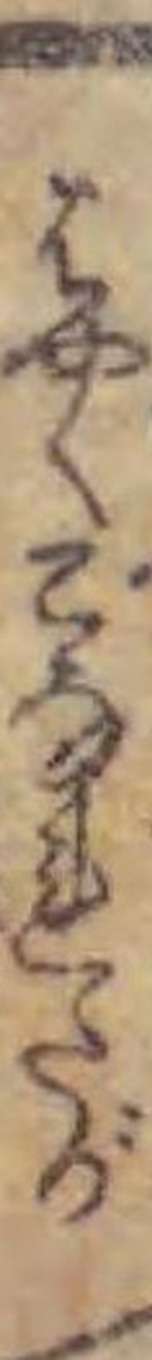はやくこなれたが
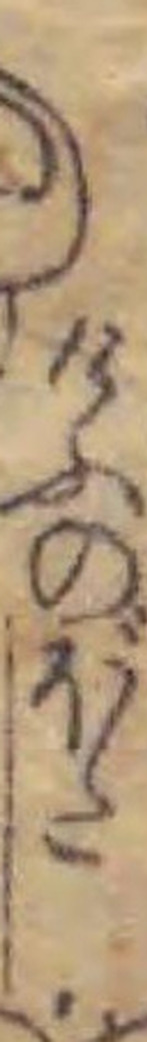けふのぼた
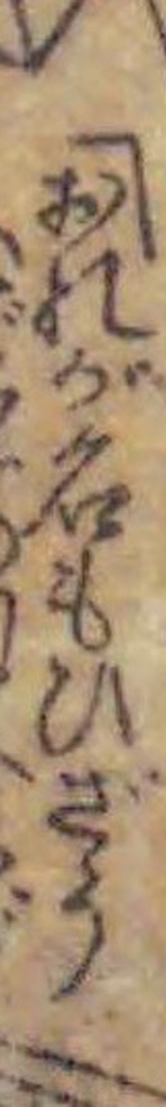〽おれが名もひざう
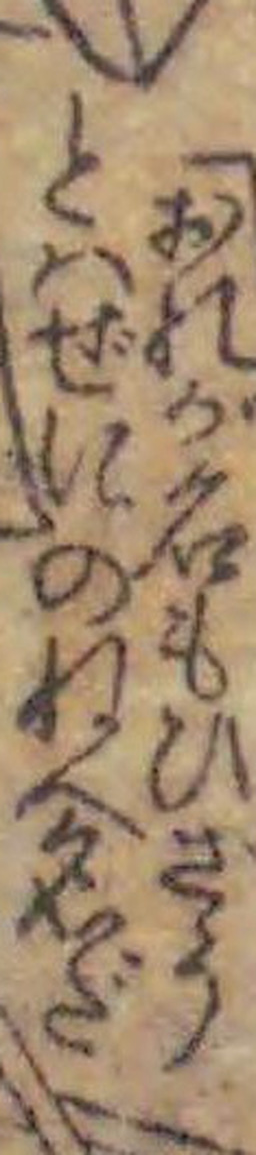とはぜにのねへ名だ
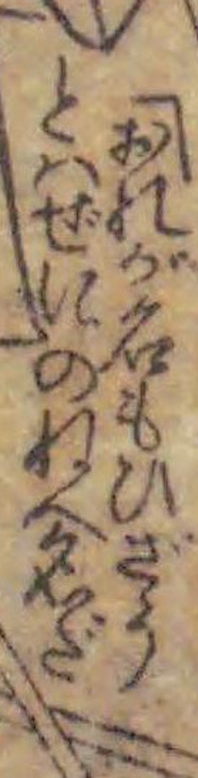〽おれが名もひざう

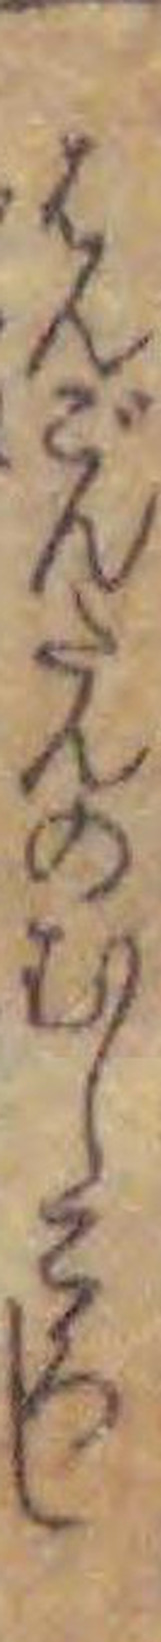はんごんたんのむしころし
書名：十四傾城腹之内 : 3巻
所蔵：国立国会図書館 National Diet Library, JAPAN
